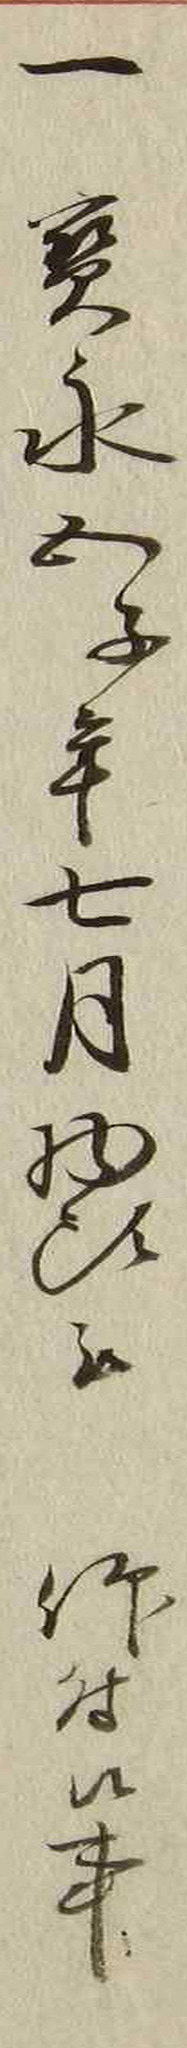一宝永五子年七月物頭被仰付候事
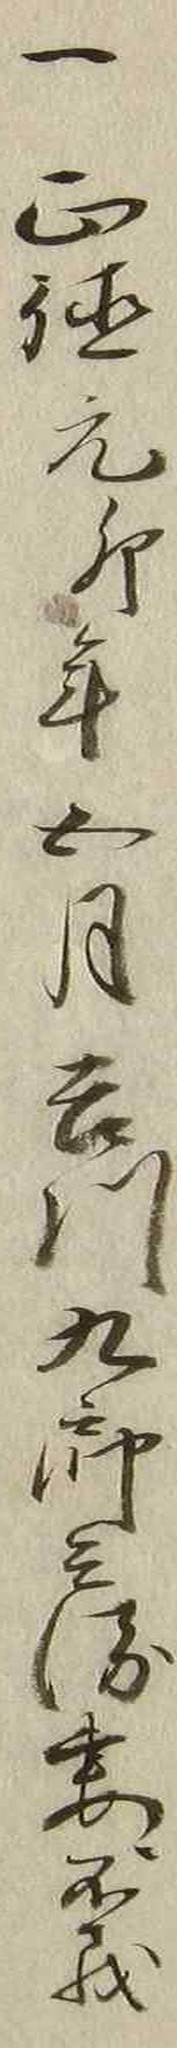一正徳元卯年五月吉川九郎兵衛妻ニ不義
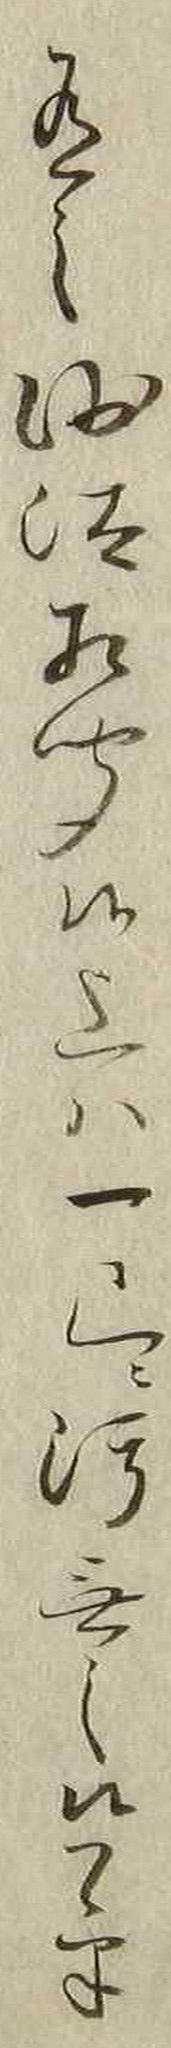有之沙汰相聞候上ハ一己ニ汚無之候ハヽ早
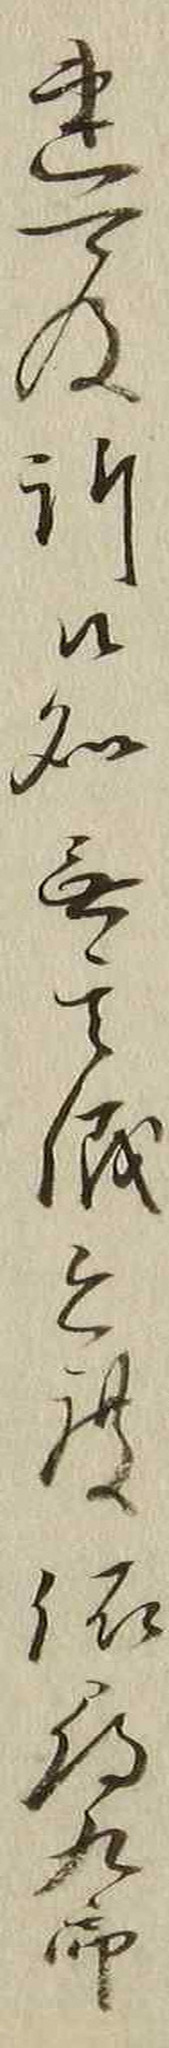速可及訴候処無其儀今度依尋九郎
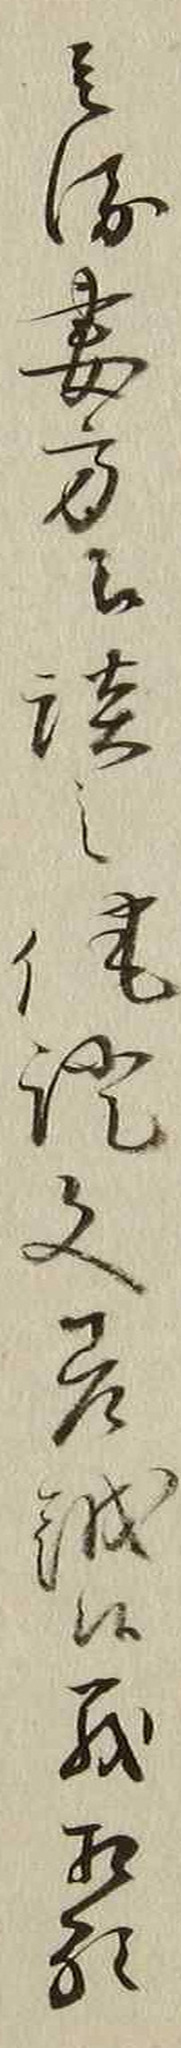兵衛妻方江談之侘証文差越候義相顕
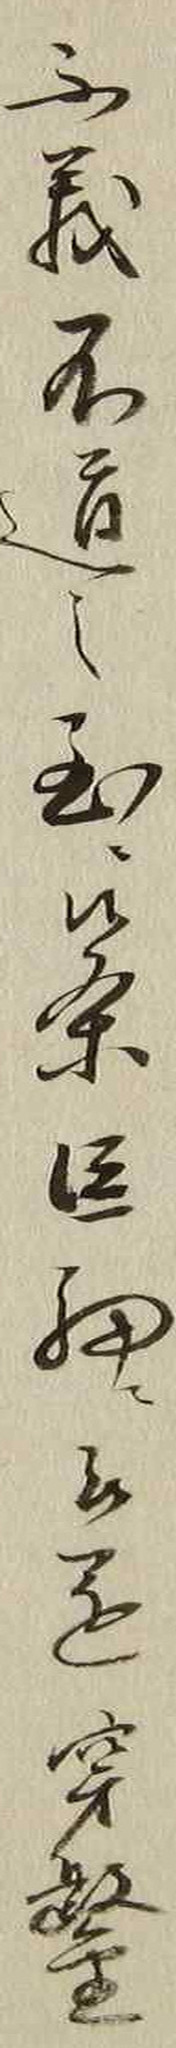不義不道之至ニ候条臣細ニ被遂穿鑿
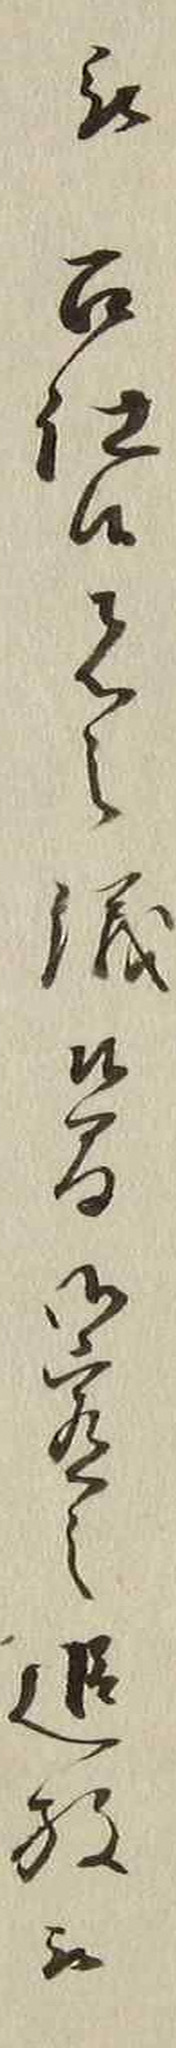被召仕候者之儀候間御宥之追放被
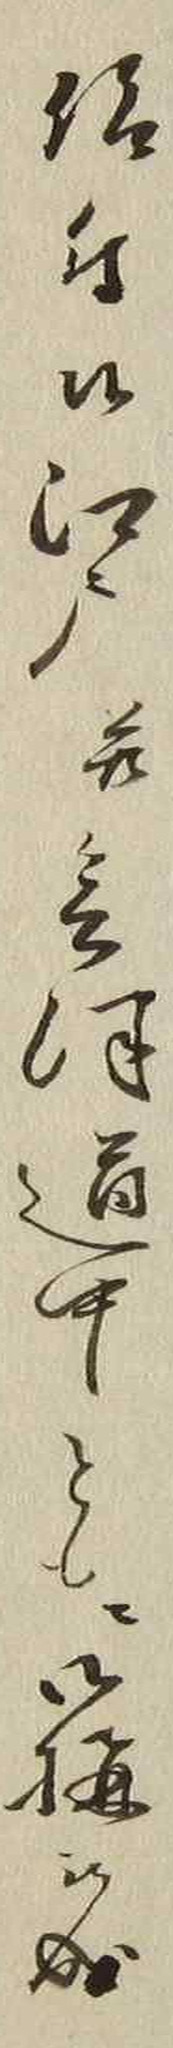仰付候江戸并会津道中ともニ御構被成
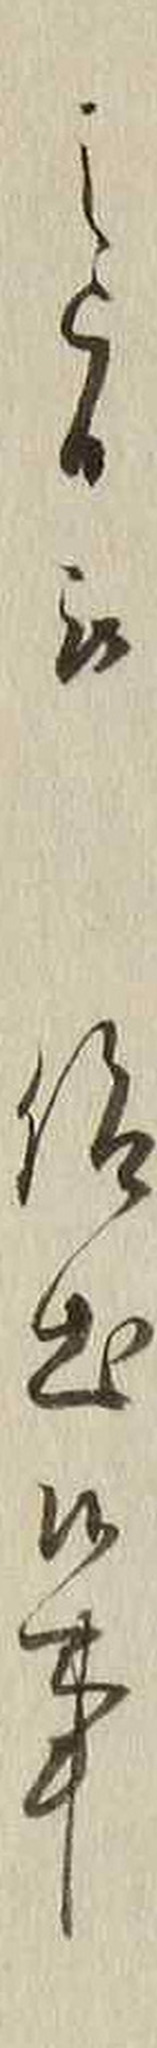之旨被仰出候事
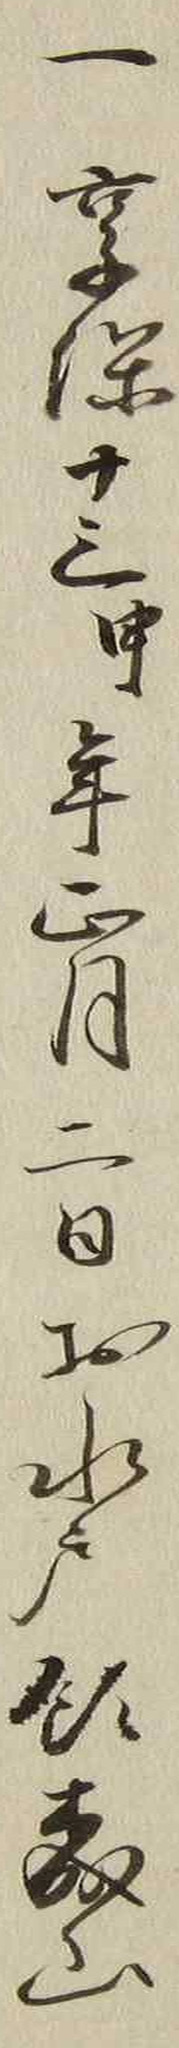一享保十三申年正月二日於水戸領森山
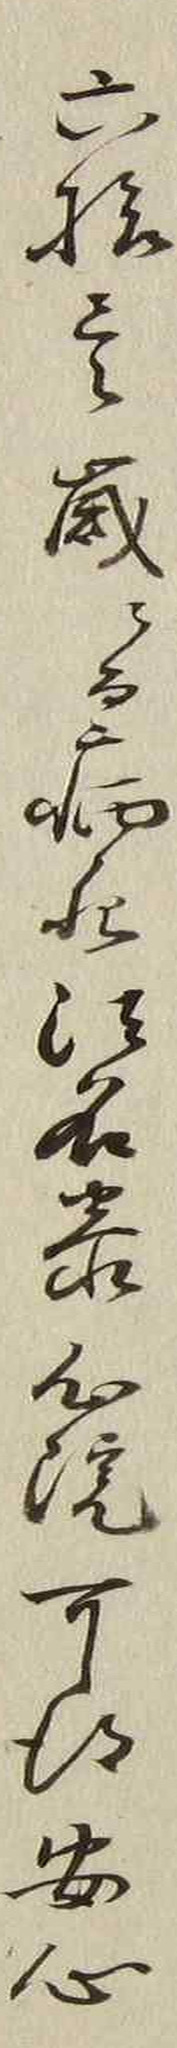六拾壱歳ニ而病死法名恭心院可得安心
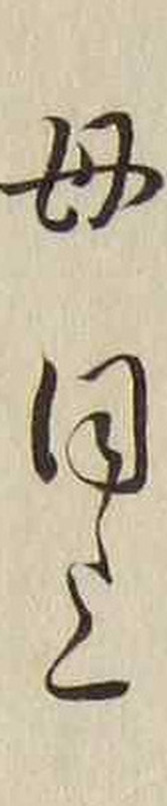母同上

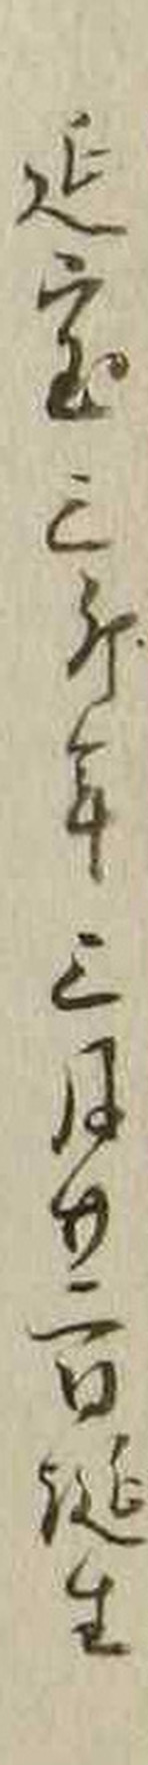延宝三卯年三月廿二日誕生
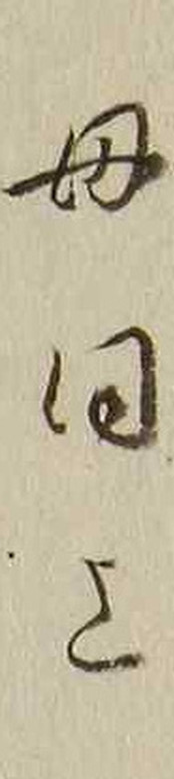母同上
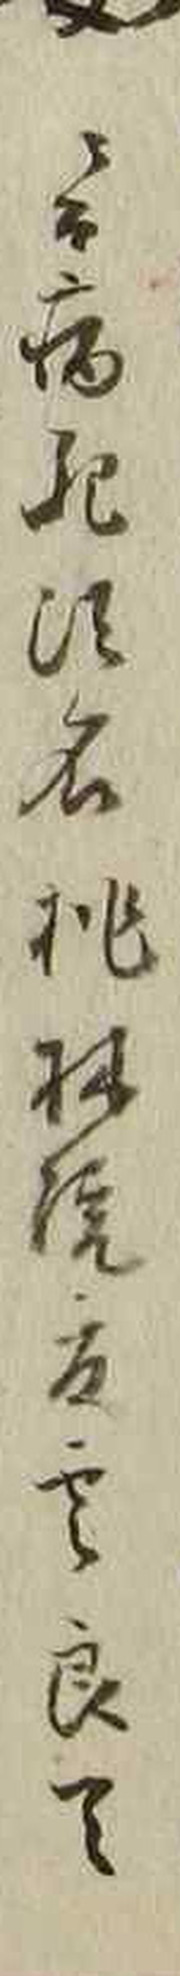ニ而病死法名桃林院夏雲良天
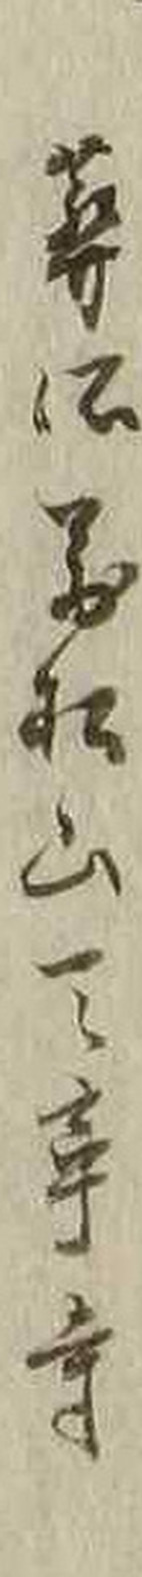葬所万松山天寧寺
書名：諸士系譜　巻之25　い之部25
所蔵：会津若松市立会津図書館
